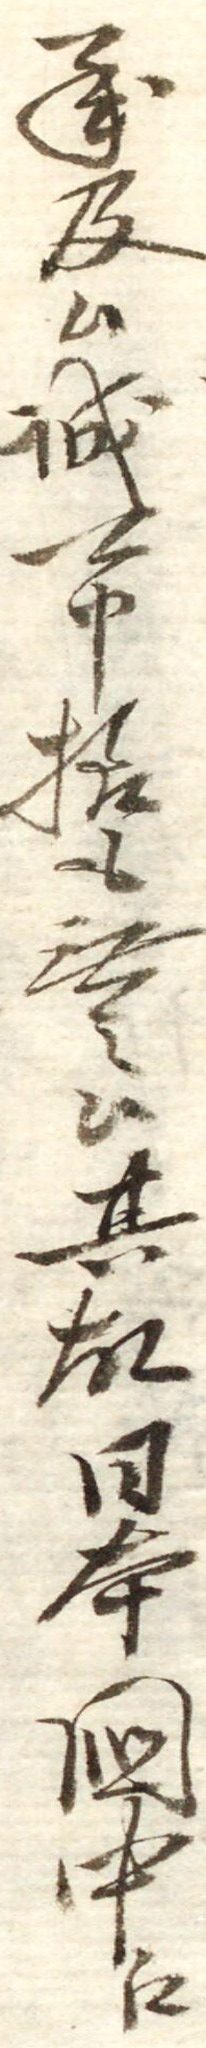承及候誠可申様も無之候其故日本国中江
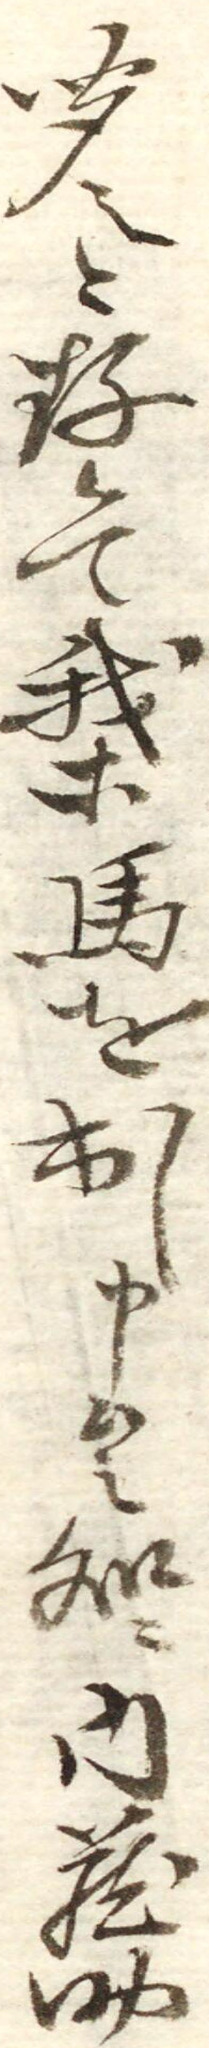聞之と存候て我等馬を出し申候之処に内蔵助
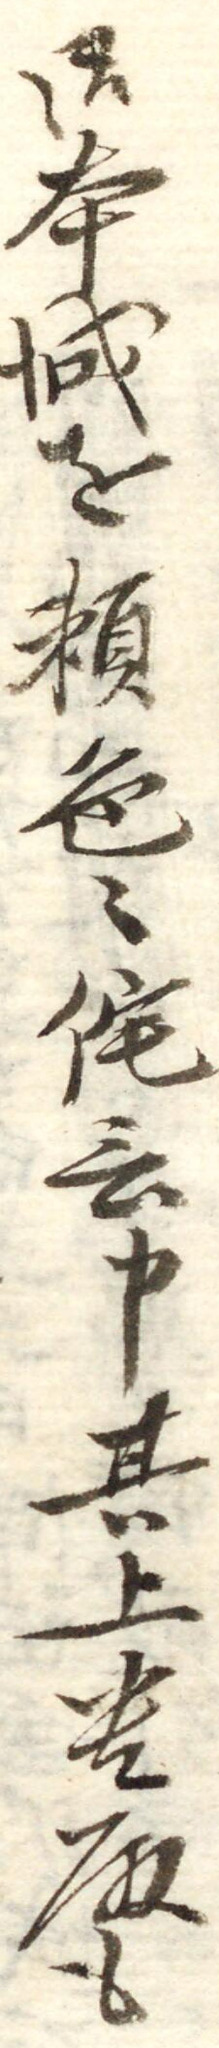御本城を頼色々侘飛申其上貴殿も
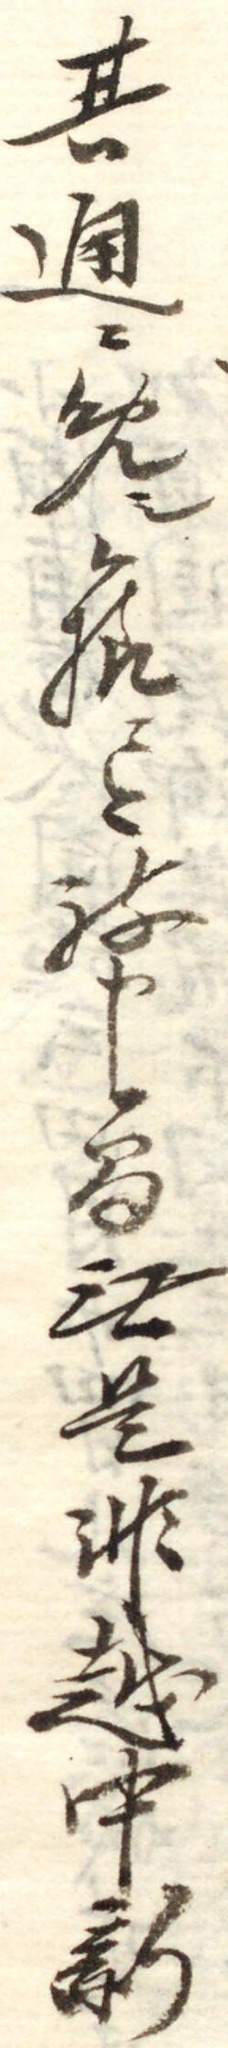其通に免し候様にと被候間無是非越中新
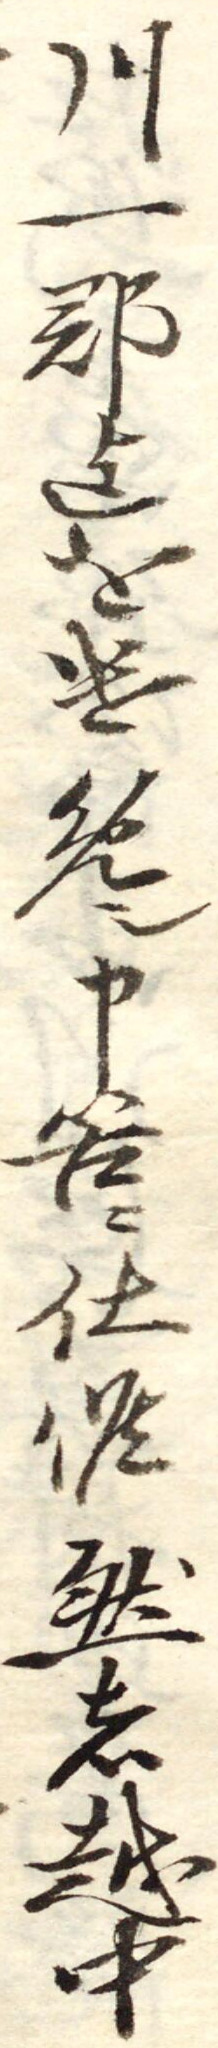川市郡迄を遣免し申筈に仕候然者越中
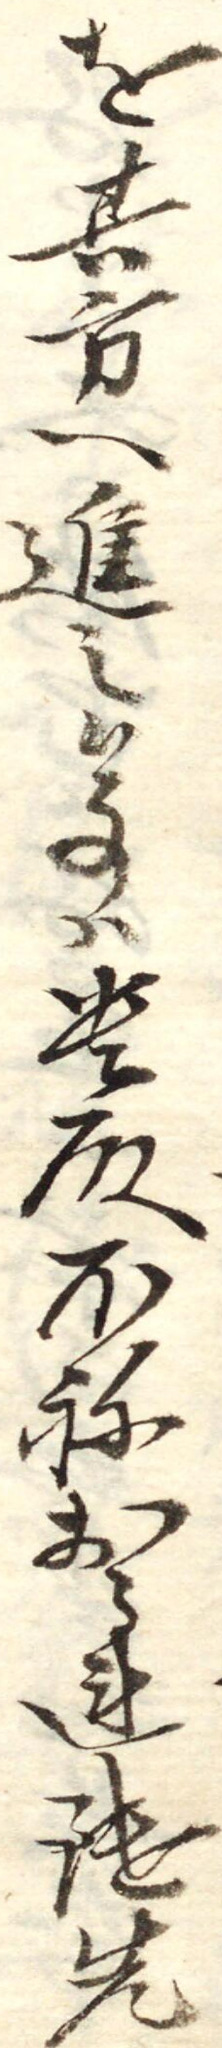を其方へ進之候事は貴殿不称おら連鑓先
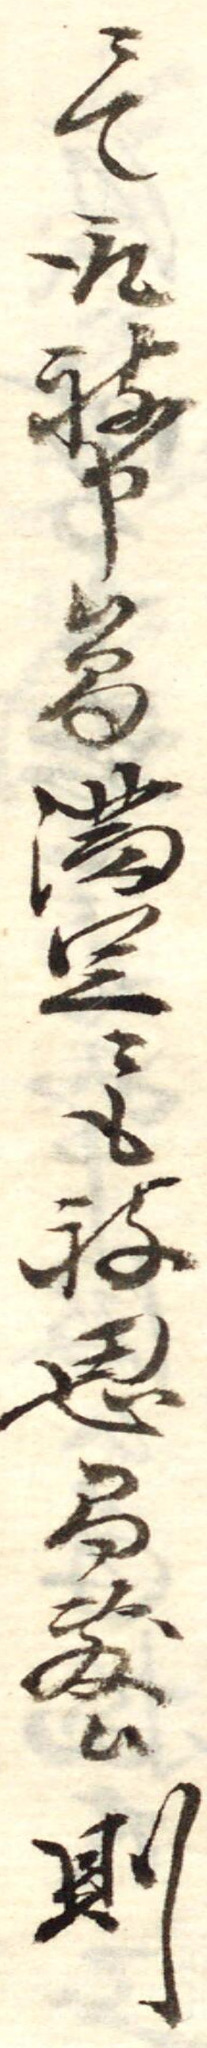にて取被申候間満足にも被思間敷候則
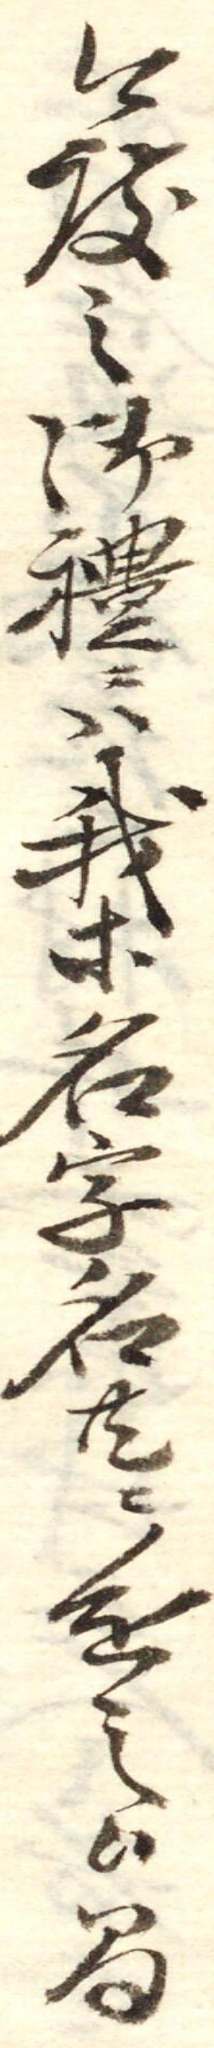今度之御禮には我等名字名共に進之候間
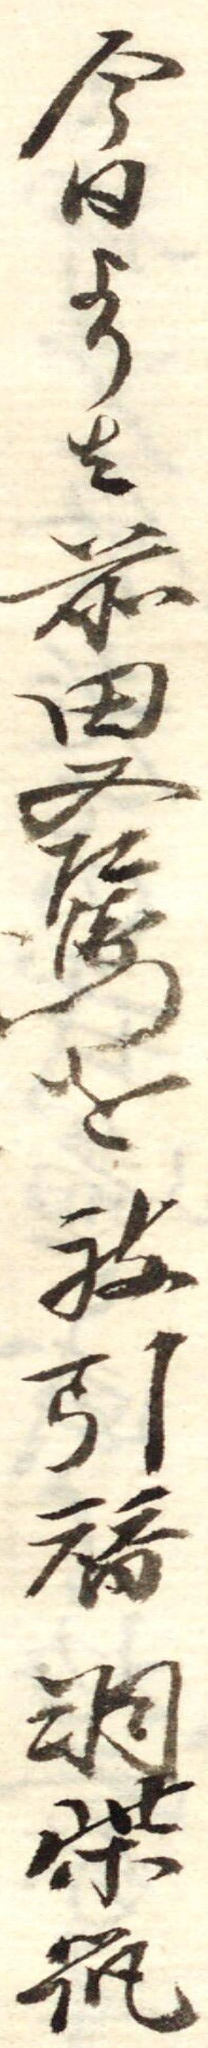今日より者前田又左衛門を被引替羽柴築
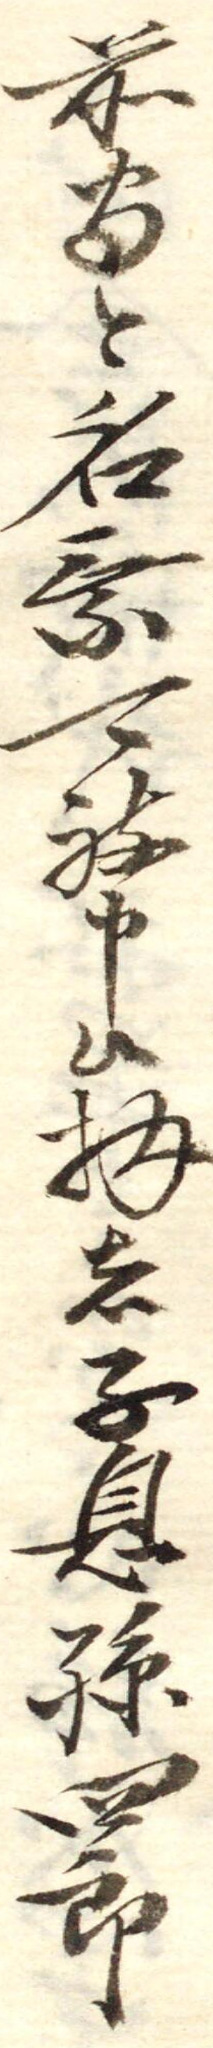前守と名乗可被申候扨者子息孫四郎
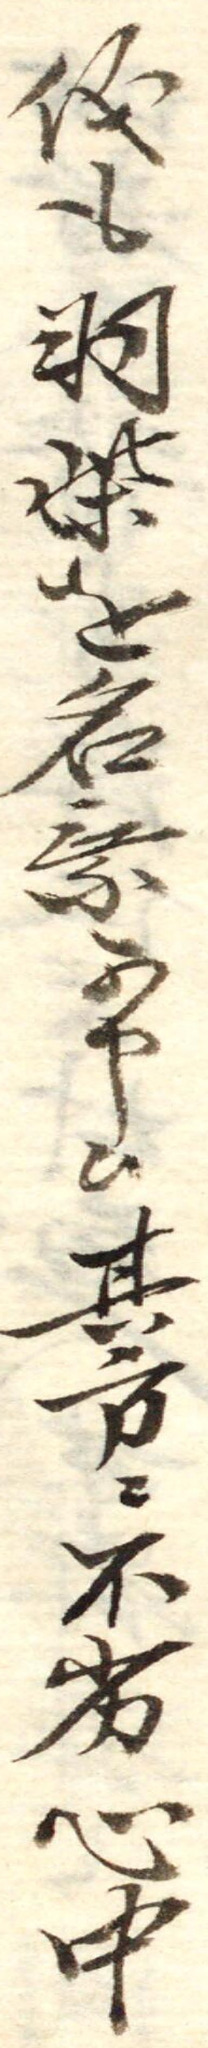儀も羽柴を名乗可申候其方に不劣心中
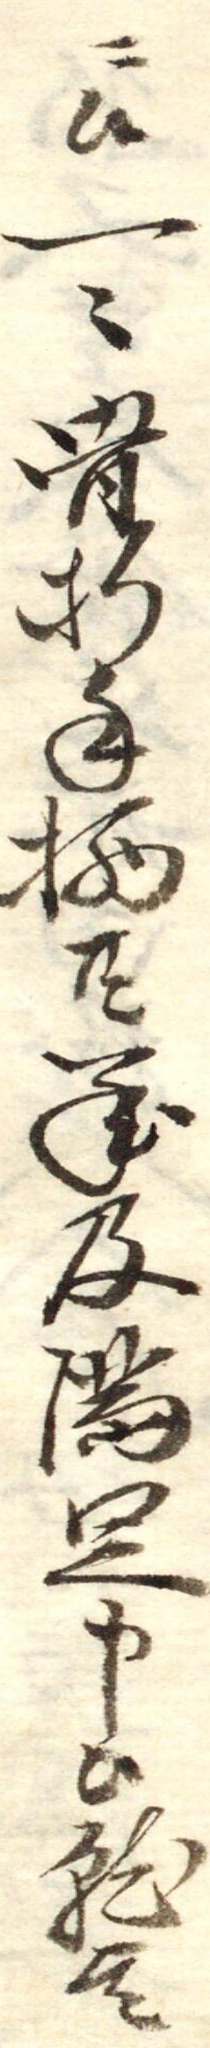に候一々骨折手柄共承及満足申候就其
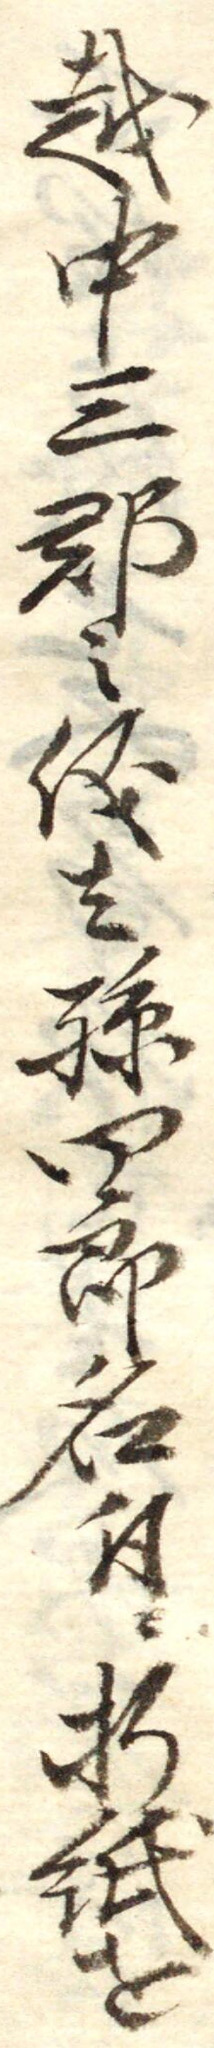越中三郡之儀者孫四郎名付に折紙を

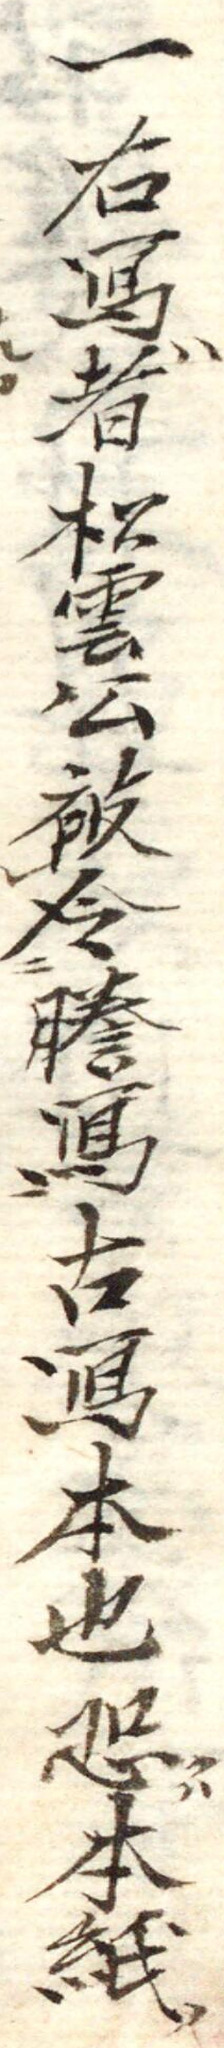一右写者松雲公被令謄写古写本也恐くは本紙
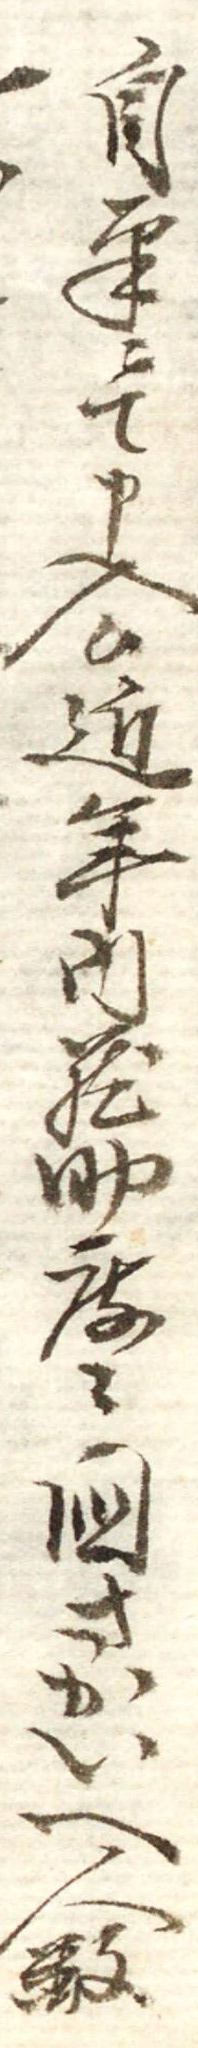自筆にて申入候近年内蔵助度々国さかいへ人数
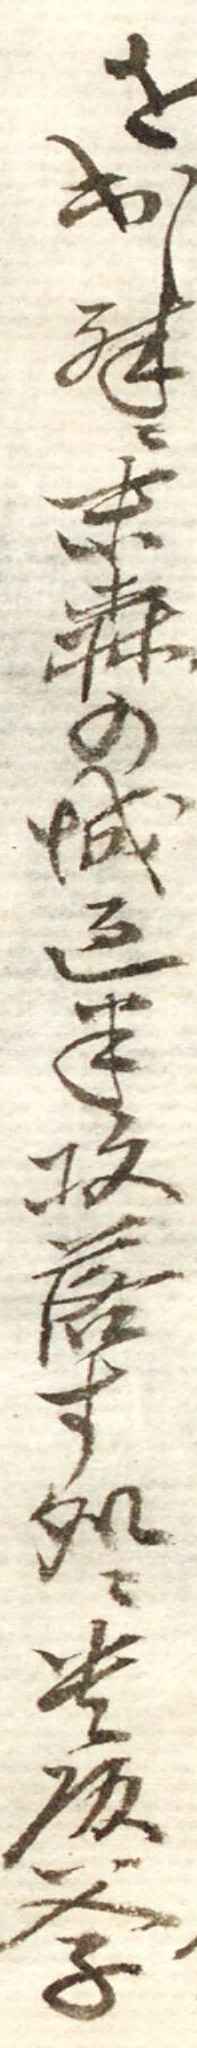を出し殊に末森の城過半攻落す処に貴殿父子
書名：前田家封国証書集録
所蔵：Ishikawa Prefectural Library
